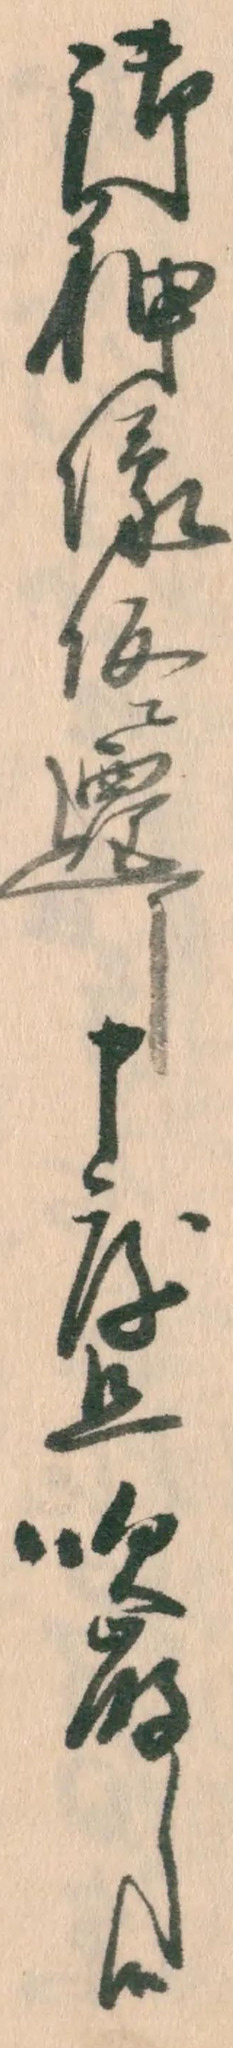御神像仮ニ遷し申度且吹崩し候
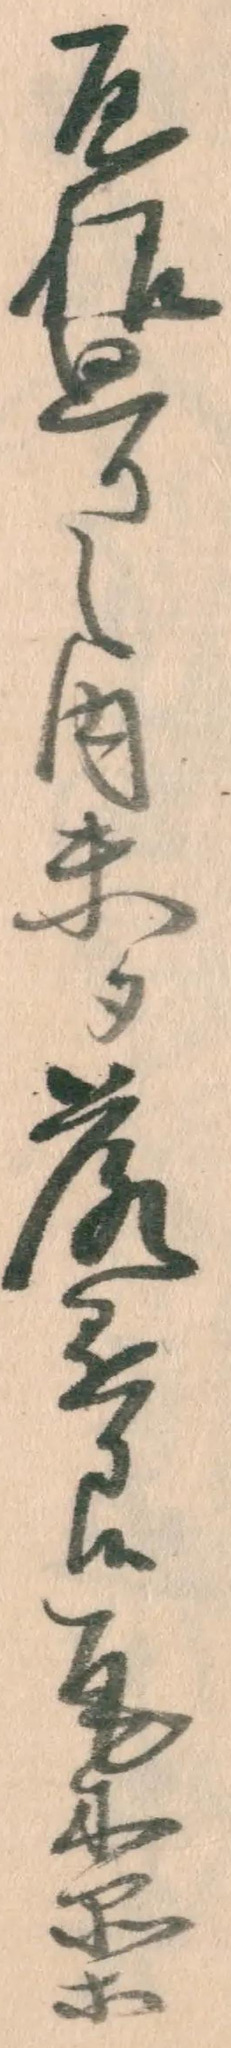屋根廻り之内未タ落懸り候瓦木品等
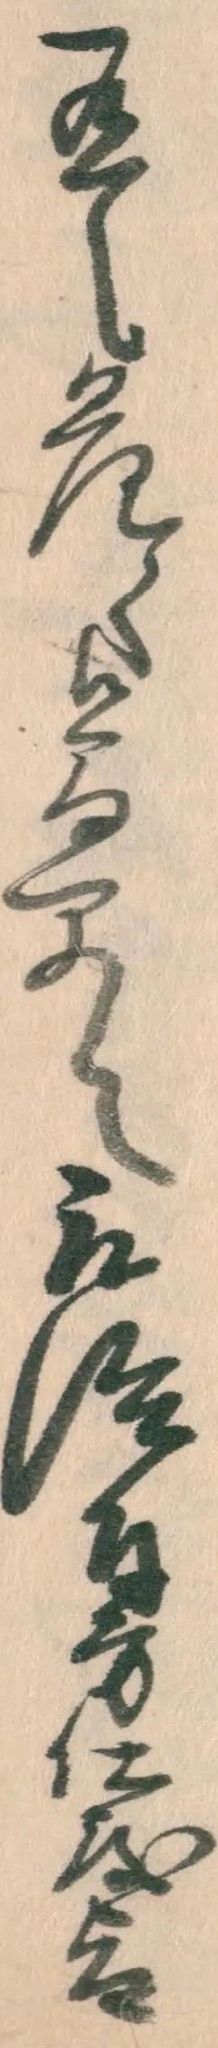有之危く候間早々取片付方仕度旨

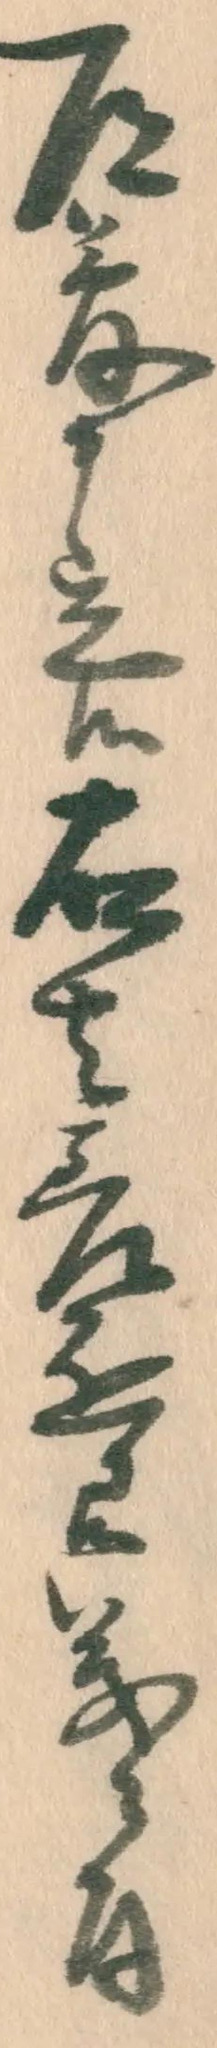道菅申立候右者差懸候義ニ付
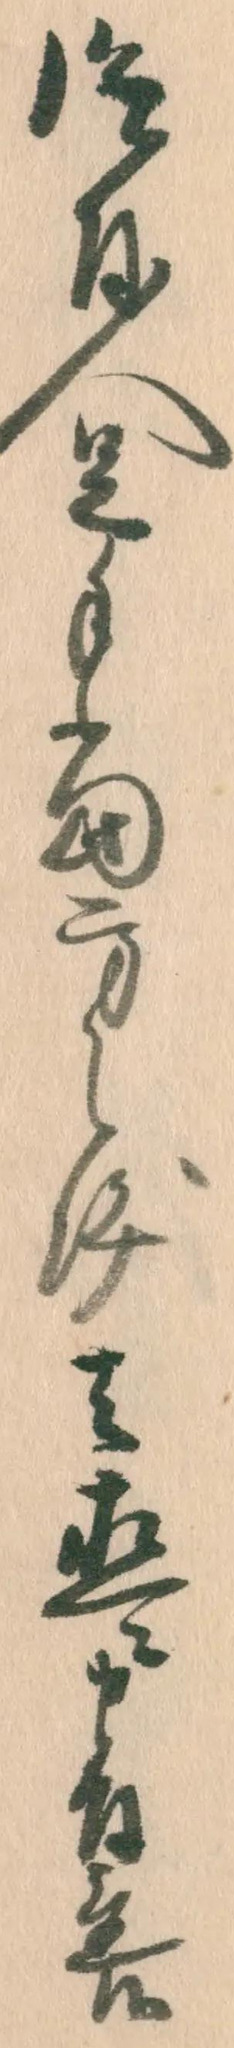片付人足手當方之儀者直ニ申付置候
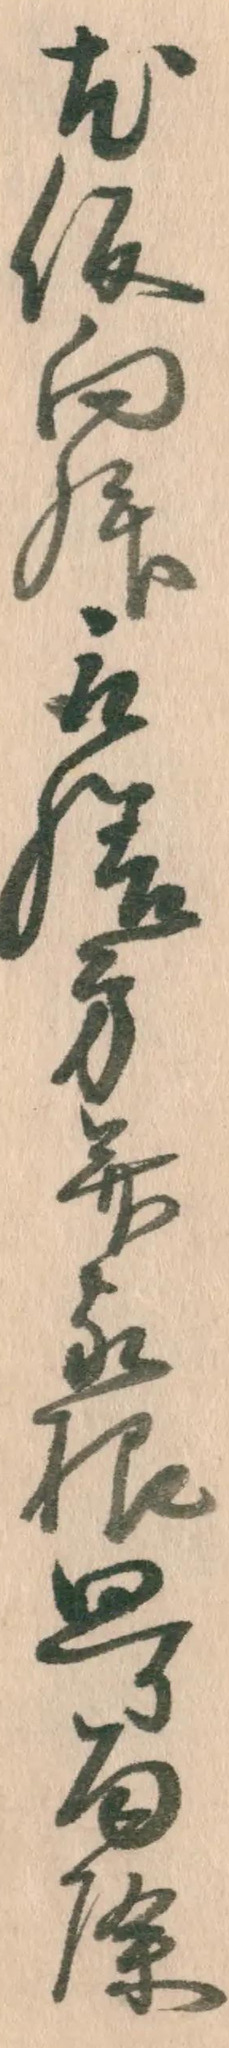尤仮向拝取繕方并家根廻り雨除
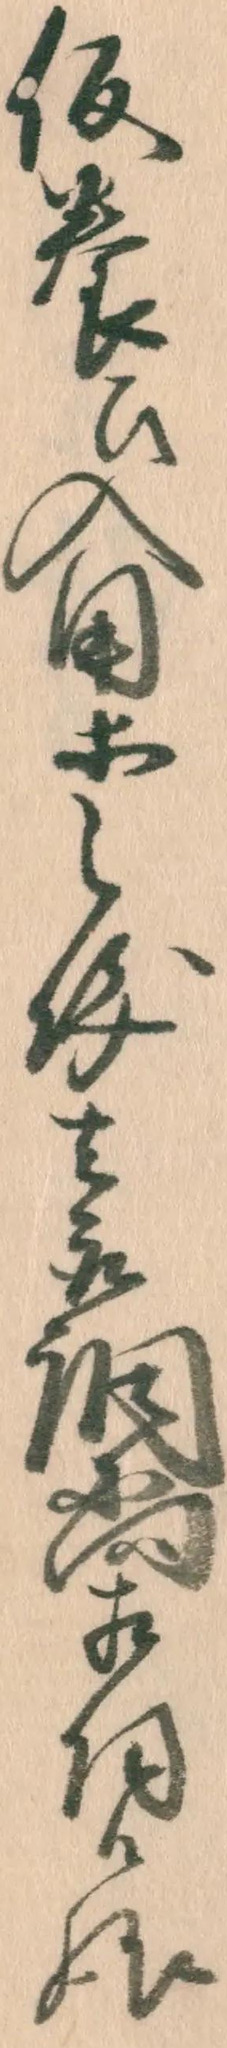仮養ひ入用等之儀者取調尚相伺候様
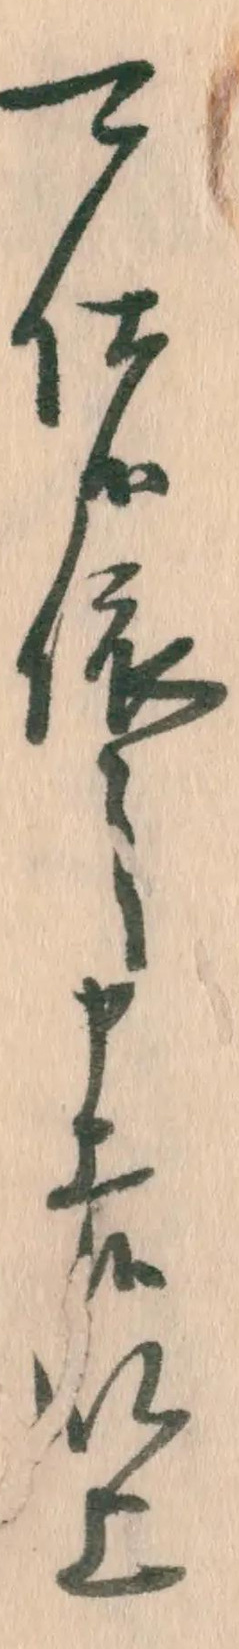可仕候依之申上候以上
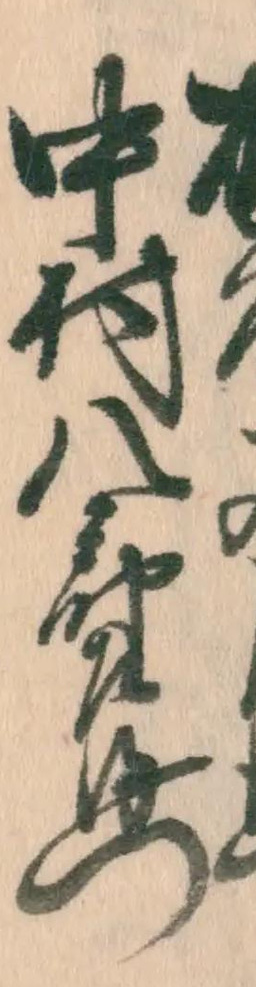中村八郎左衛門
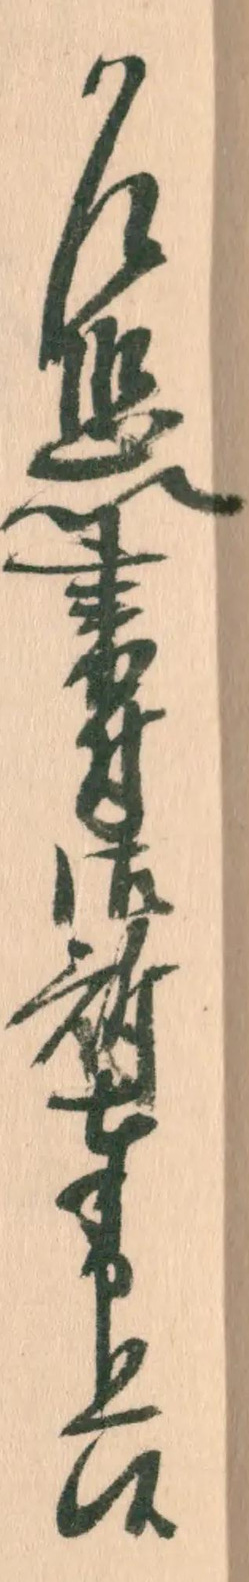乍恐以書付御訴奉申上候
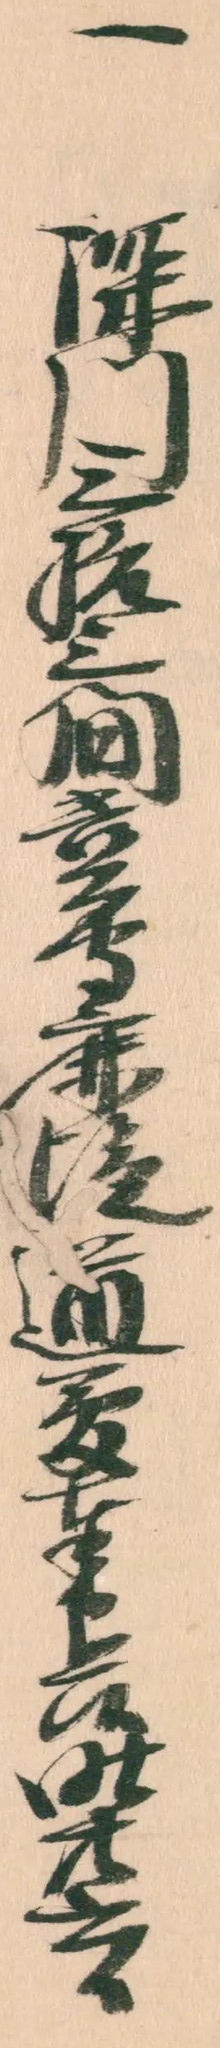深川三拾三間堂守鹿塩道菅奉申上候昨廿六日
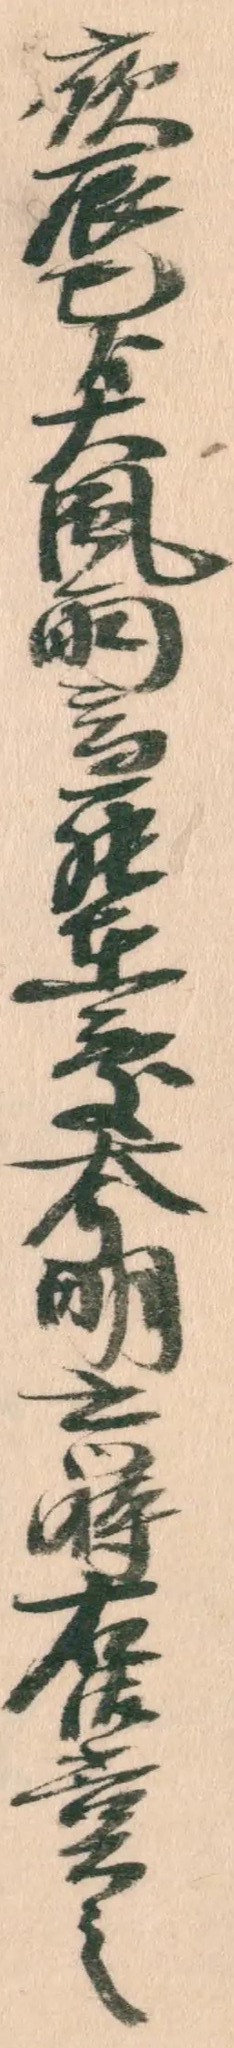夜辰巳ゟ大風雨ニ而罷在處本明六ツ時右御堂之
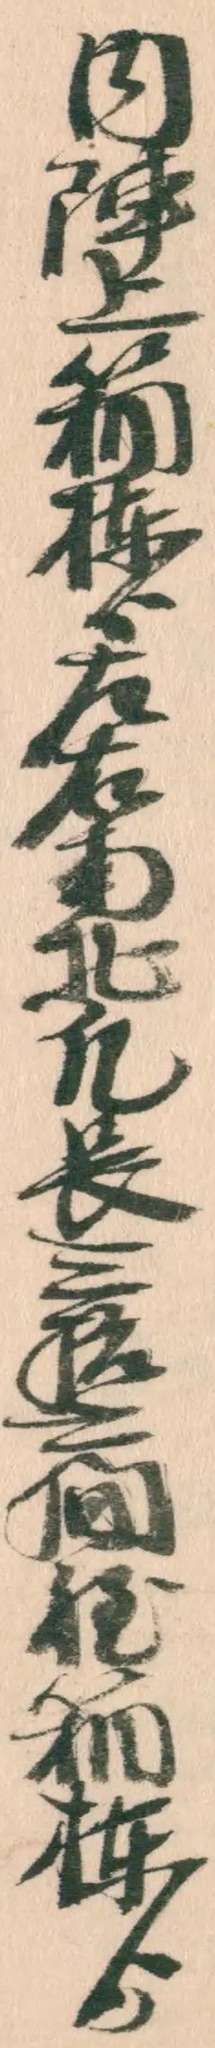内陣上箱棟ゟ左右南北凡長三拾六間程箱棟ゟ
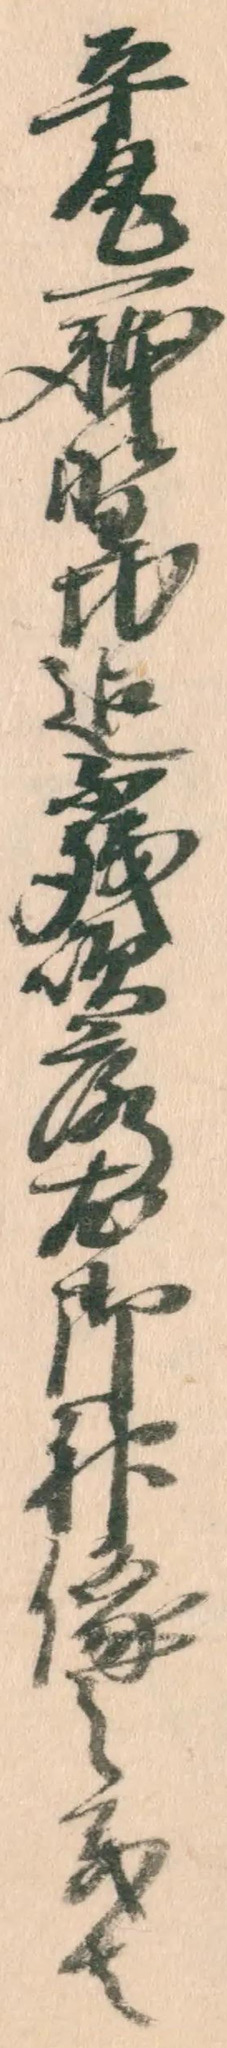平瓦一体野地迄不残吹落尤御神像之義は
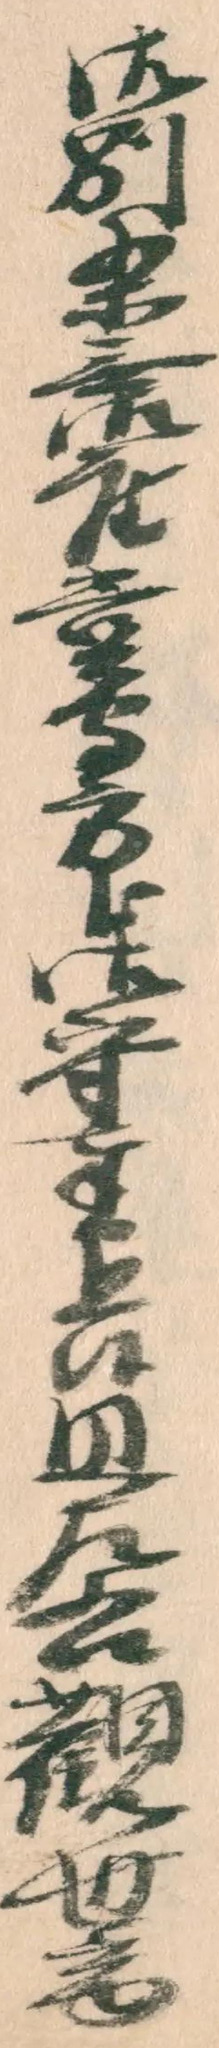御別条無御座堂守方江御守奉申上候且左右観世音

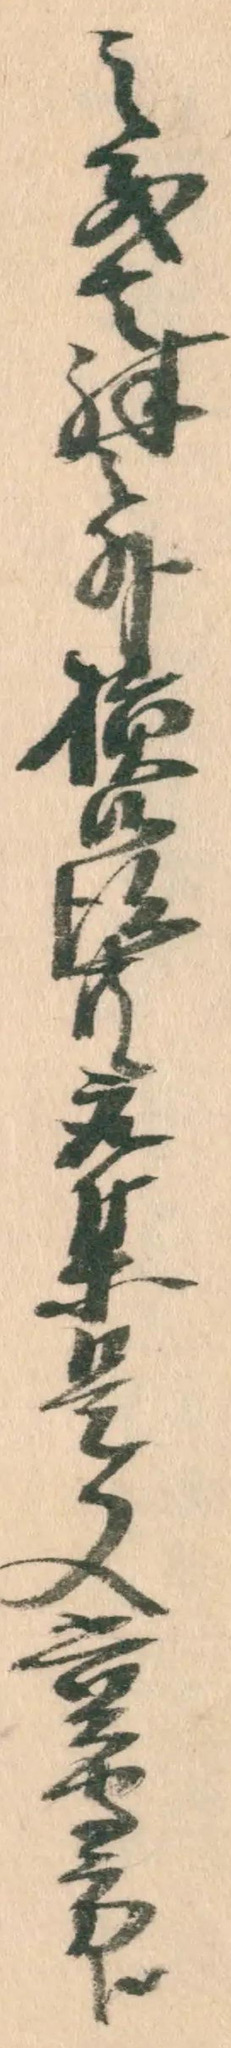之義は殊之外損候得共取集是又堂守方え
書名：三十三間堂. [1]
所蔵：国立国会図書館 National Diet Library, JAPAN
